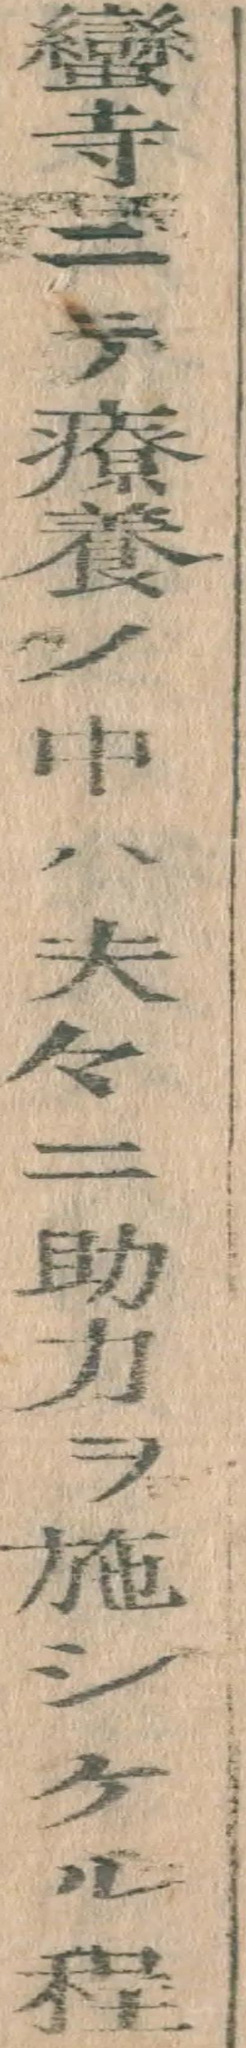蛮寺ニテ療養ノ中ハ夫々ニ助力ヲ施シケル程

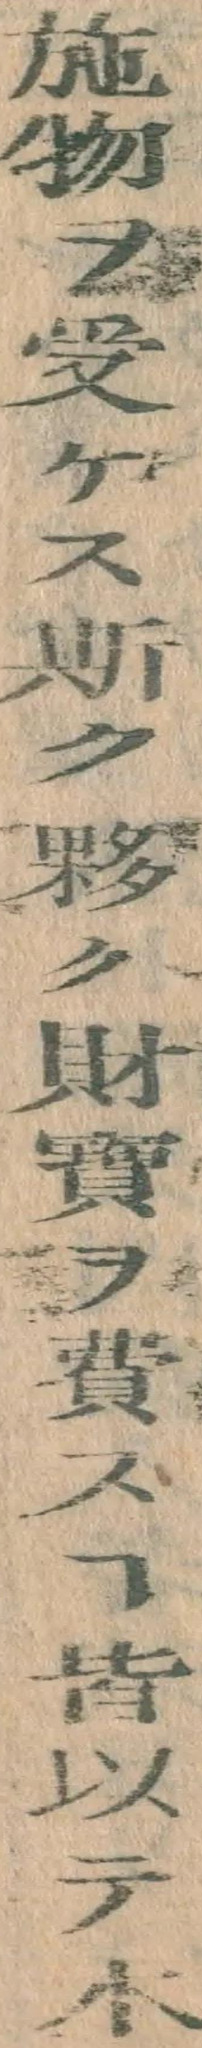施物ヲ受ケス斯ク夥ク財宝ヲ費スヿ皆以テ本
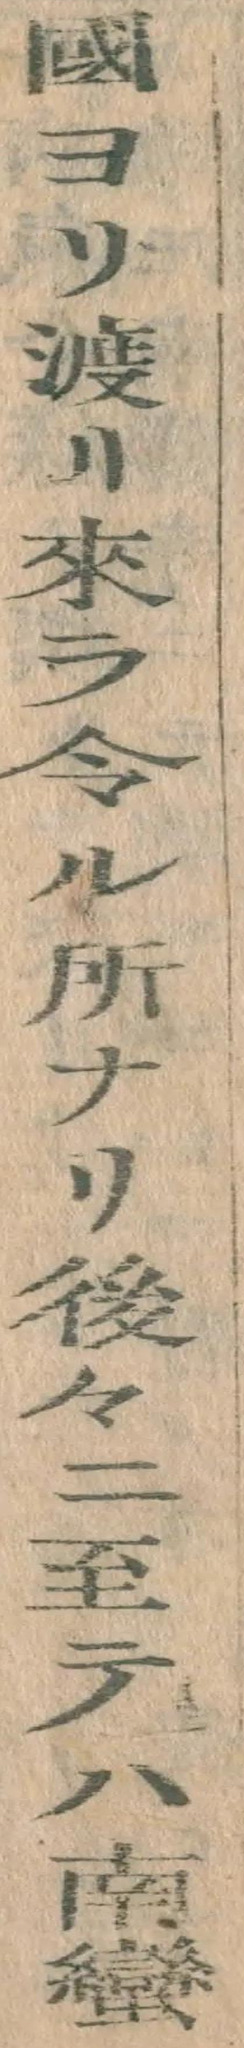国ヨリ渡リ来ラ令ル所ナリ後々ニ至テハ南蛮
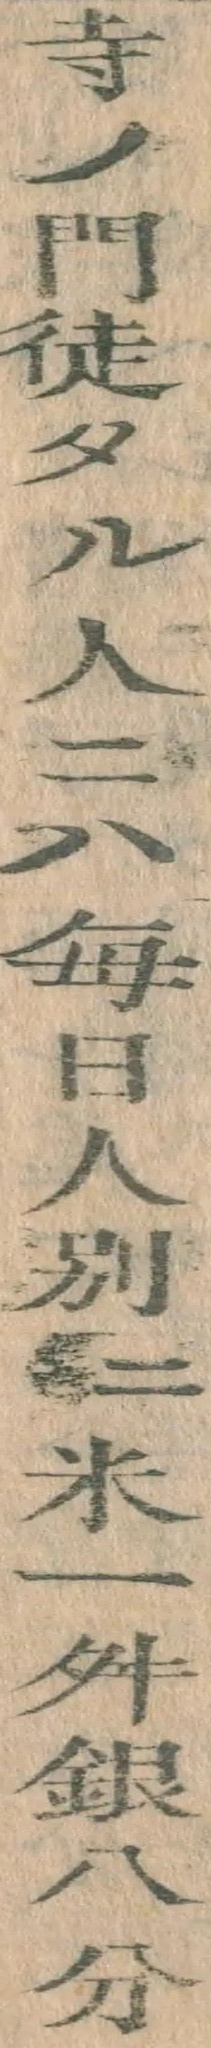寺ノ門徒タル人ニハ毎日人別ニ米一舛銀八分
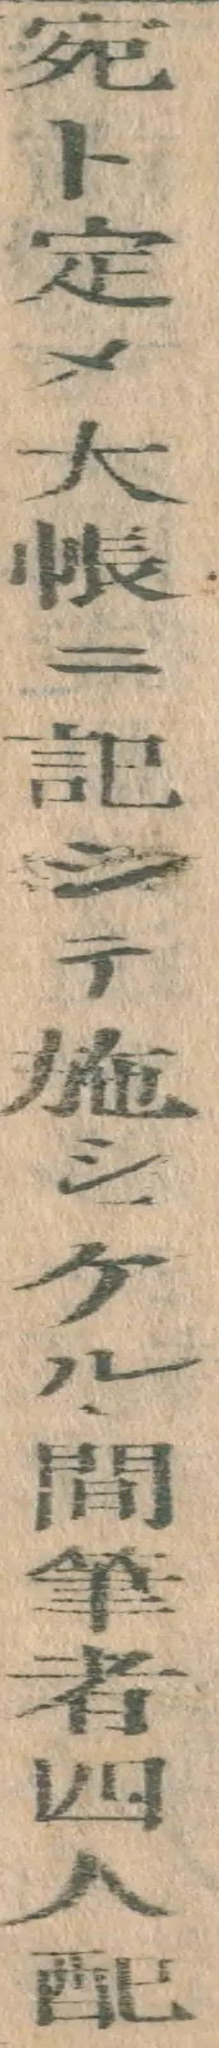宛ト定メ大帳ニ記シテ施シケル間筆者四人配
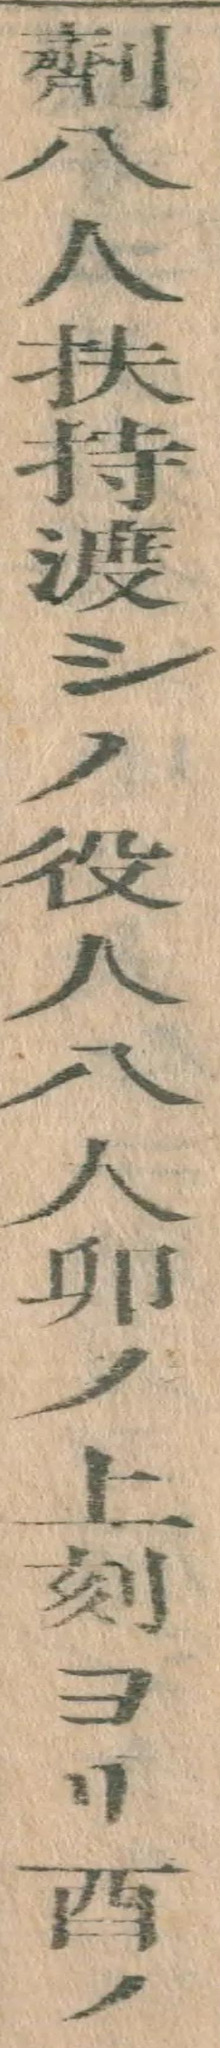剤八人扶持渡シノ役人八人卯ノ上刻ヨリ酉ノ
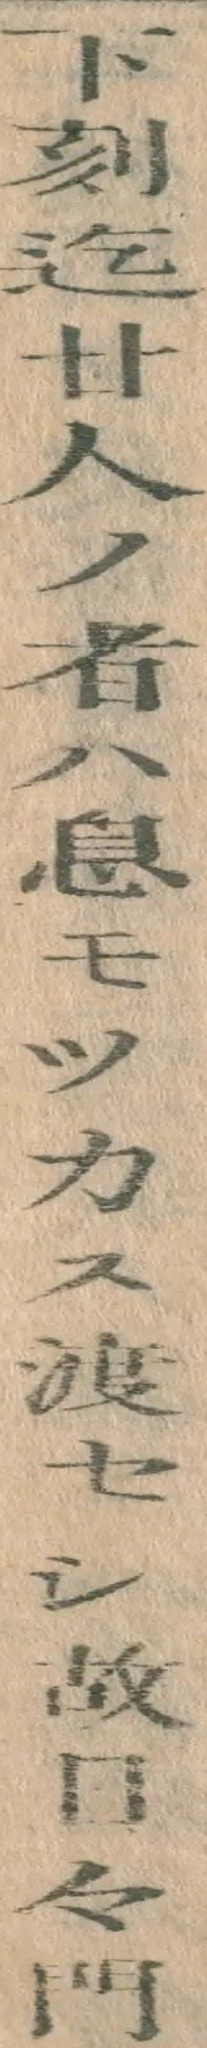下刻迄廿人ノ者ハ息モツカス渡セシ故日々門
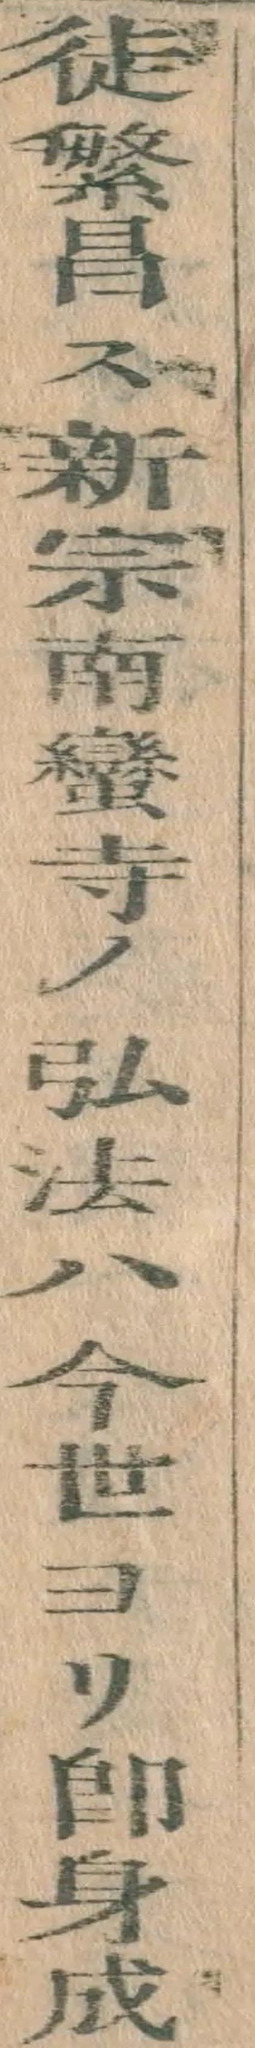徒繁昌ス新宗南蛮寺ノ弘法ハ今世ヨリ即身成
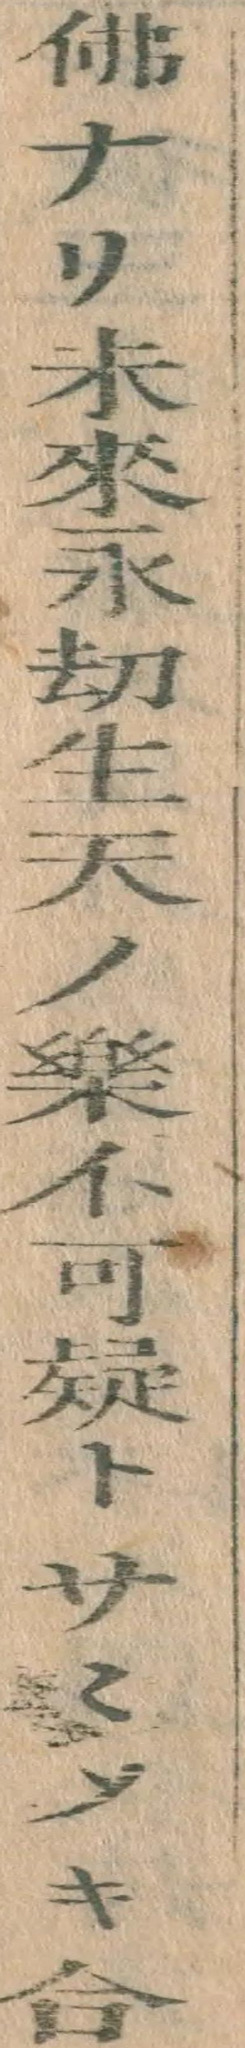仏ナリ未来永劫生天ノ楽不可疑トサ〱メキ合
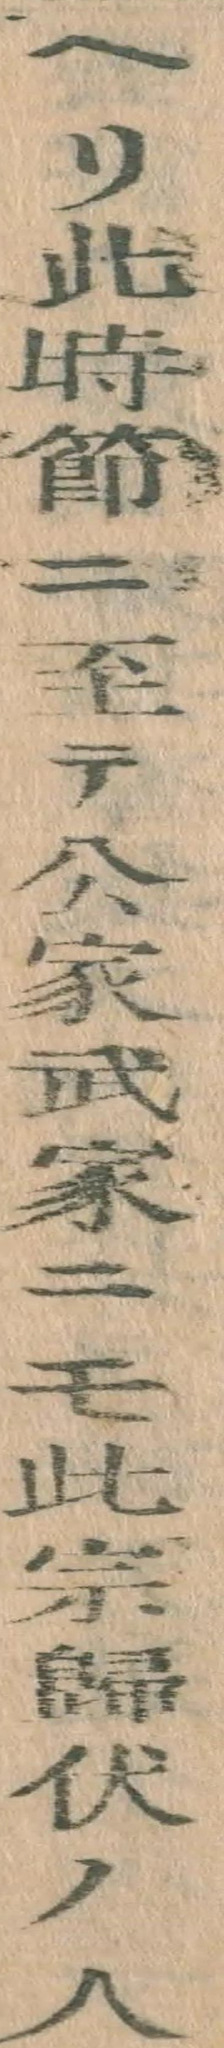ヘリ此時節ニ至テ公家武家ニモ此宗帰伏ノ人
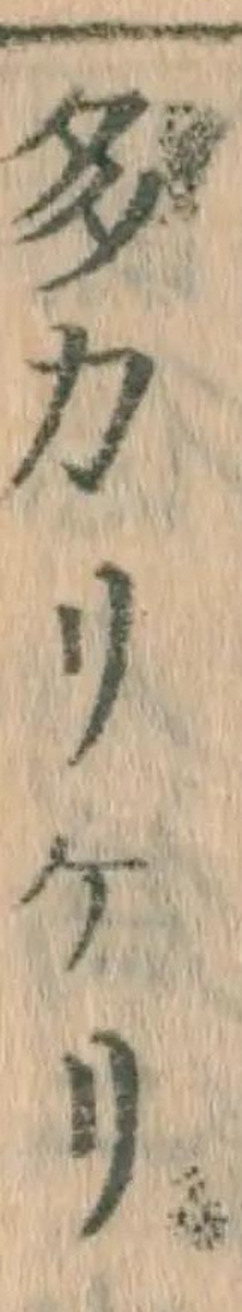多カリケリ
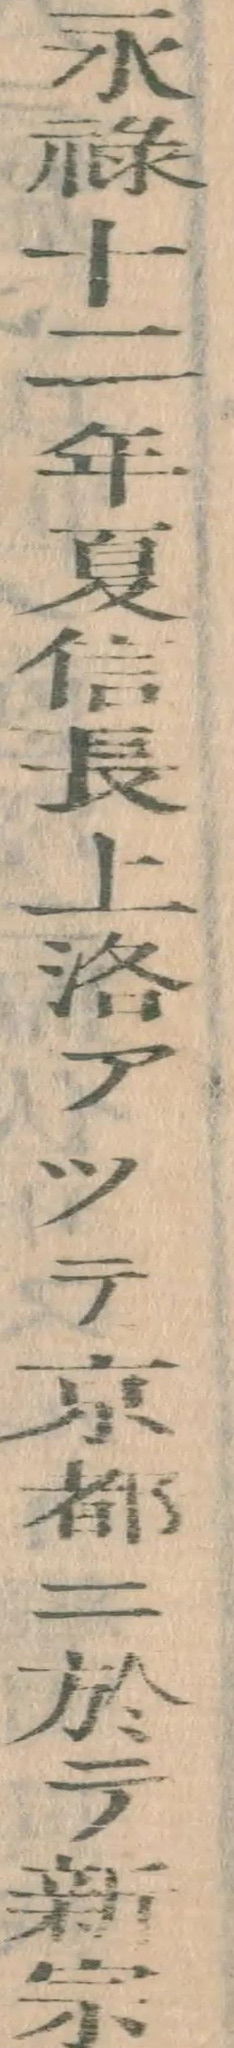永禄十二年夏信長上洛アツテ京都ニ於テ新宗
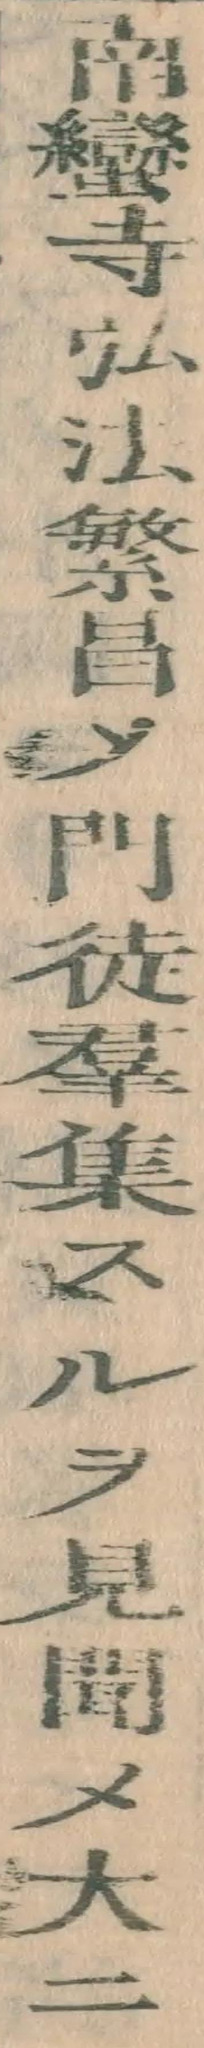南蛮寺弘法繁昌シテ門徒群集スルヲ見聞シテ大ニ
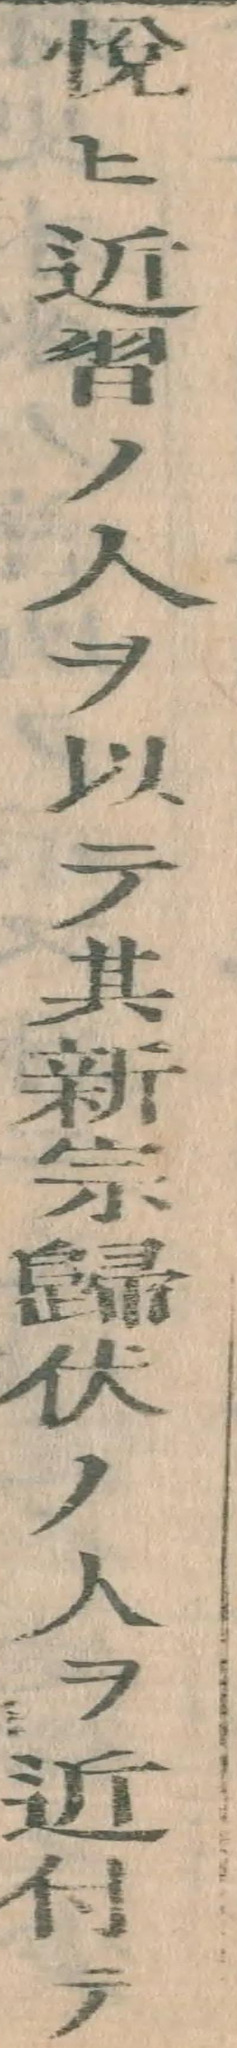悦ヒ近習ノ人ヲ以テ其新宗帰伏ノ人ヲ近付テ
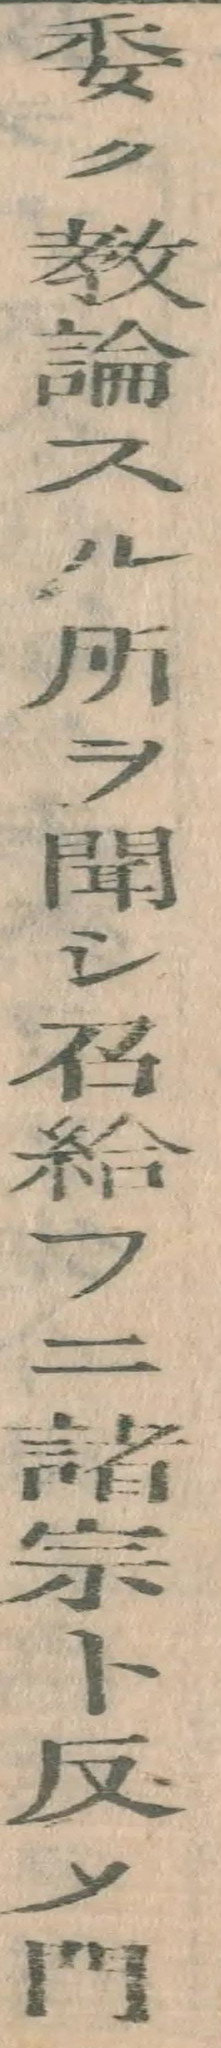委ク教論スル所ヲ聞シ召給フニ諸宗ト反シテ門
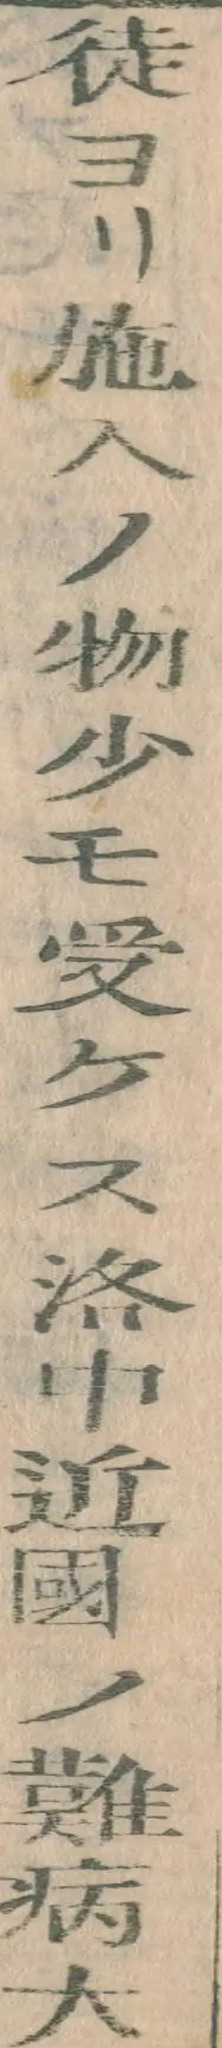徒ヨリ施入ノ物少モ受ケス洛中近国ノ難病大
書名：南蛮寺興廃記
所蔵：国立国会図書館 National Diet Library, JAPAN
